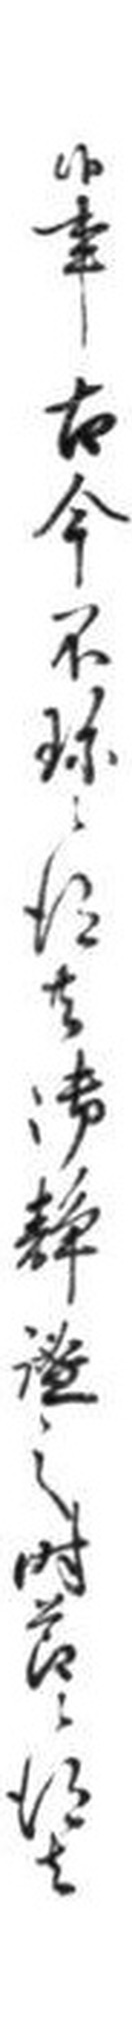候事古今不珎候得共斗静謐之時節候得者
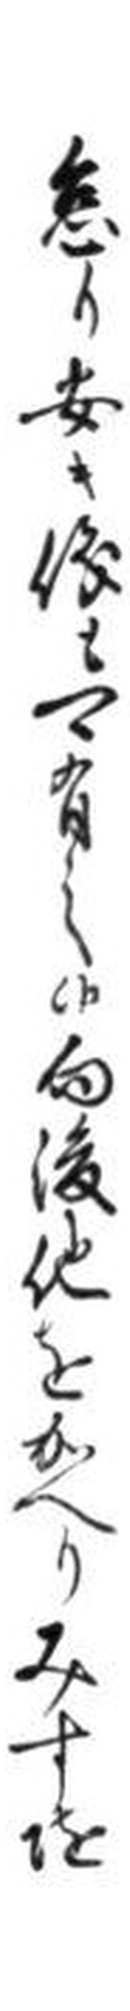怠り安キ儀も可有之候向後他をかへりみす随
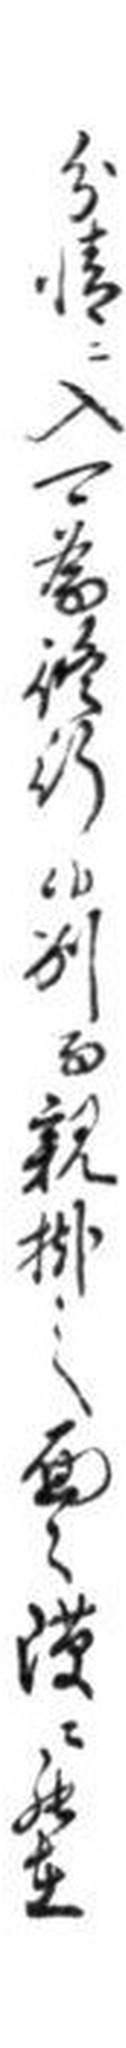分情ニ入可為修行候別而親掛之面々隙ニ罷在
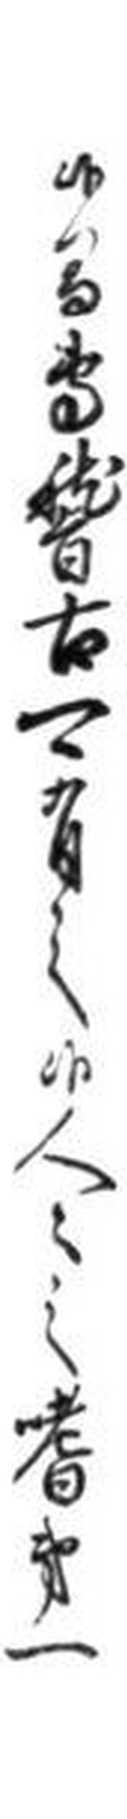候間専稽古可有之候人々之嗜第一
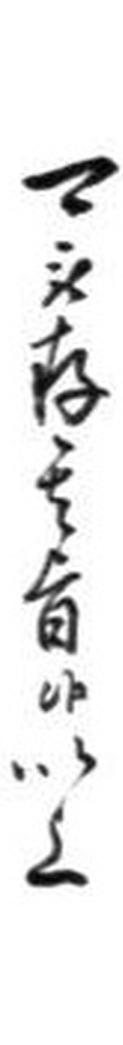可被存其旨候以上
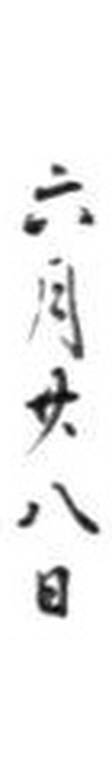六月廿八日
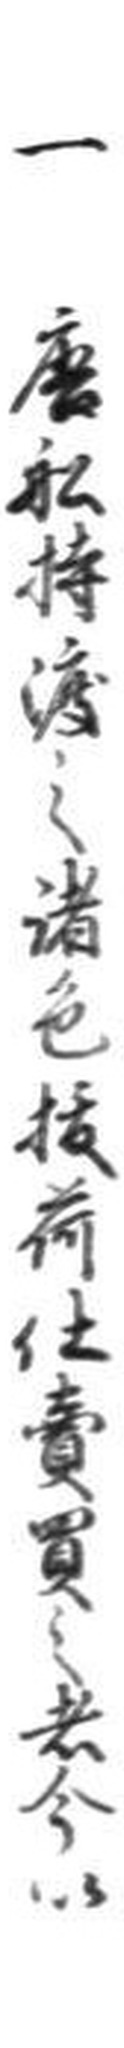一唐船持渡之諸色抜荷仕売買之者今以
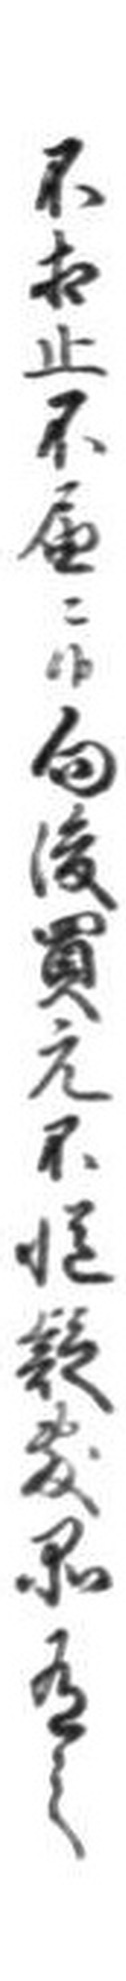不相止不届ニ候向後買元不慥疑敷品有之
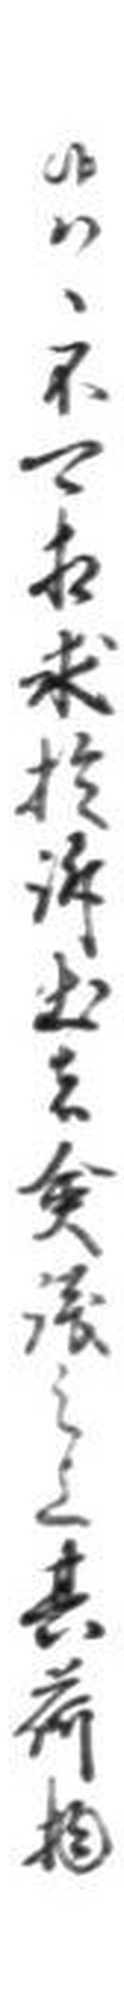候ハヽ不可相求於訴出者僉議之上其荷物
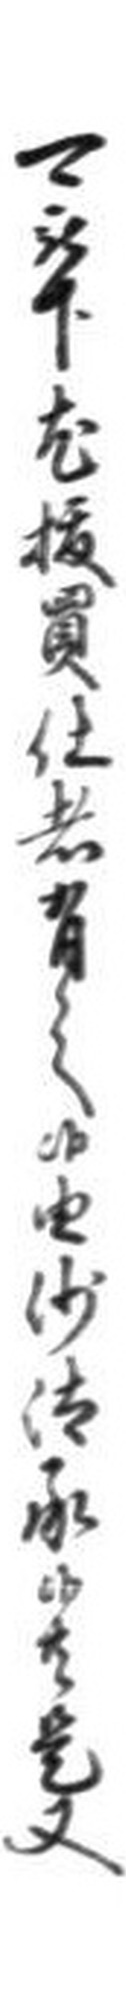可被下尤抜買仕者有之候由沙汰承候共是又
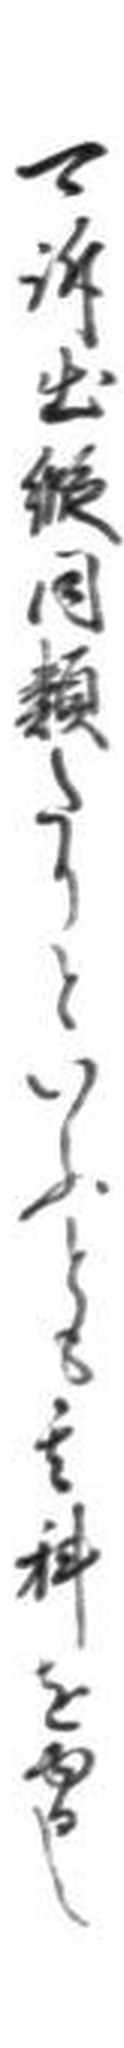可訴出縦同類たりといふとも其科をゆるし

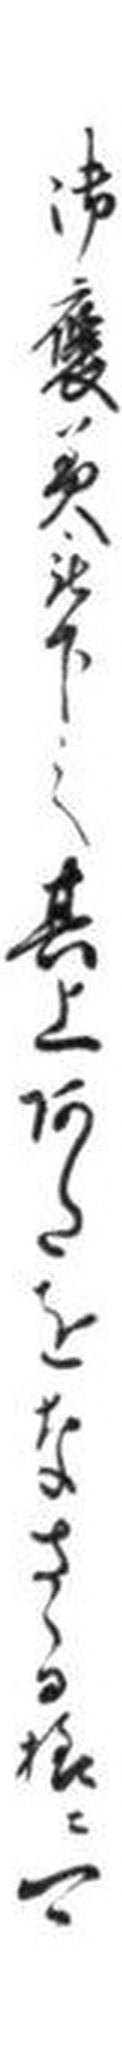御褒美被下之其上あたをなさゝる様ニ可
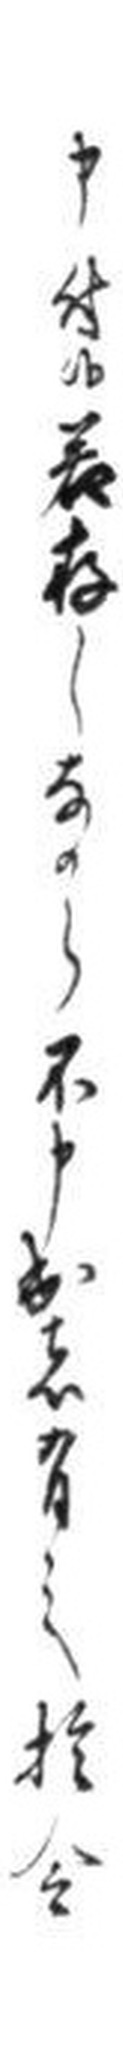申付候若存しなから不申出者有之於令
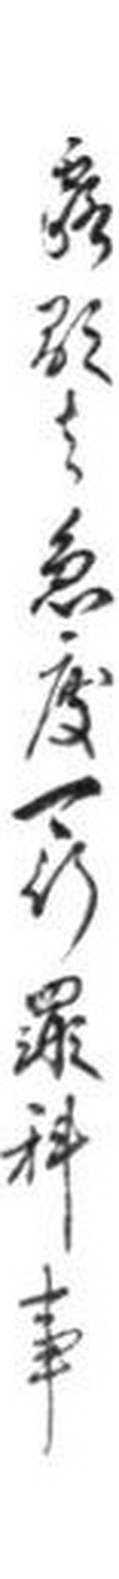露顕者急度可行罪科事
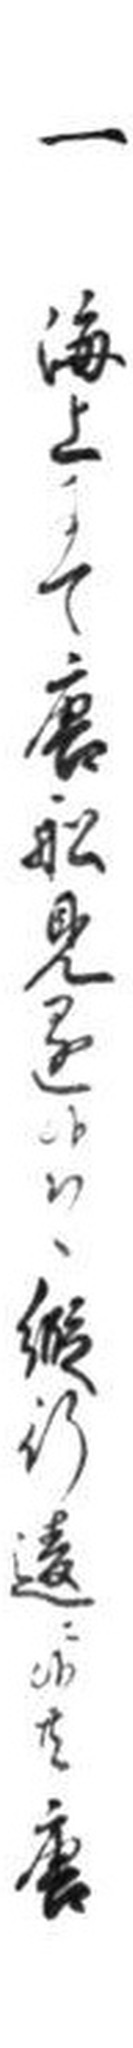一海上にて唐船見懸候ハヽ縦行違ニ候共唐
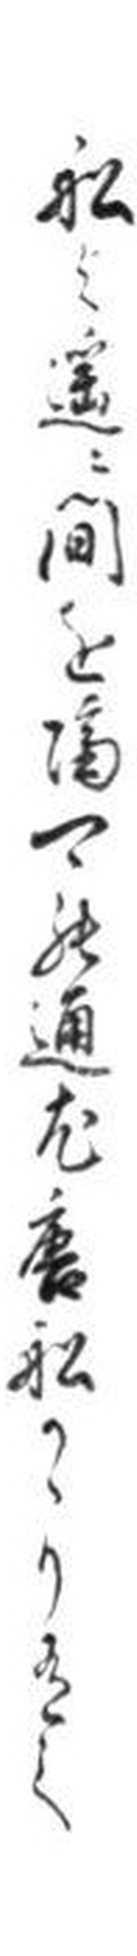船之遥ニ間を隔可罷通尤唐船かゝり有之
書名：家譜 三十二 吉邦公 従享保二年到享保三年
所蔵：福井県文書館 Fukui Prefectural Archives
